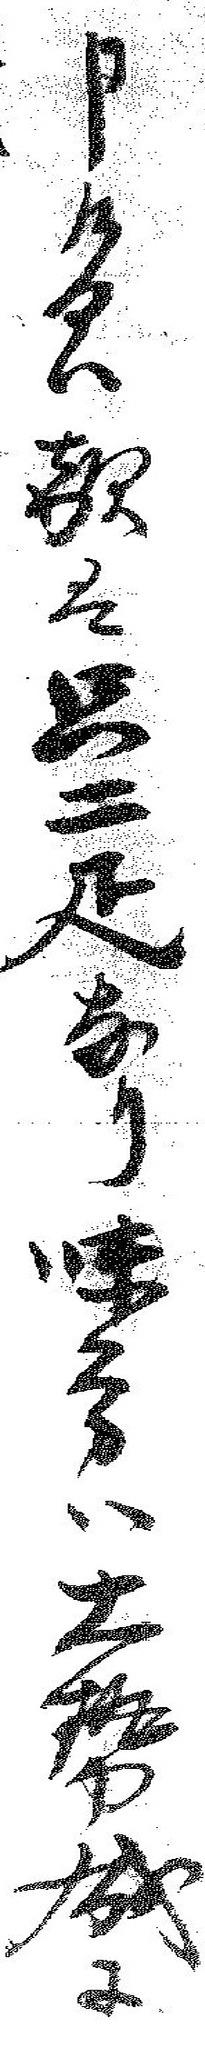申けるは敵は只二疋なり味方は大勢成に
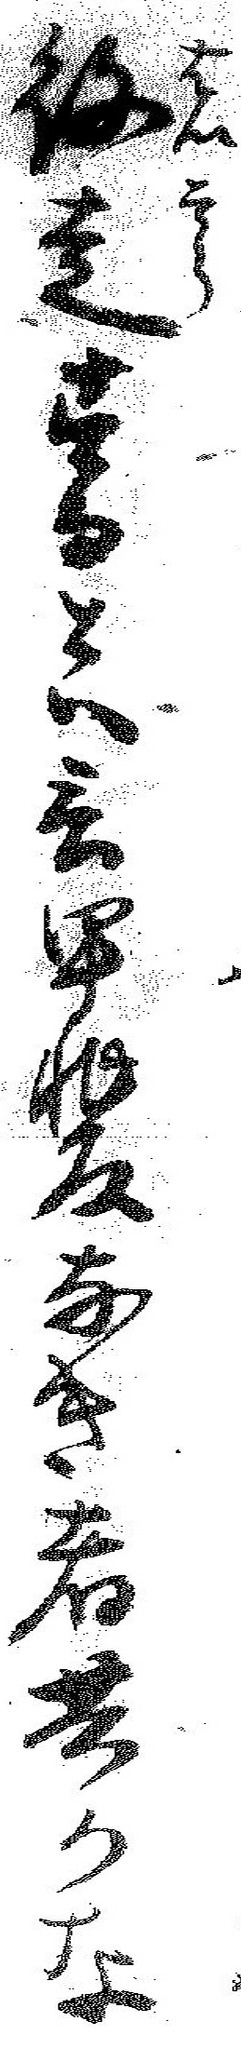敗走するとは言甲斐なき者共かな
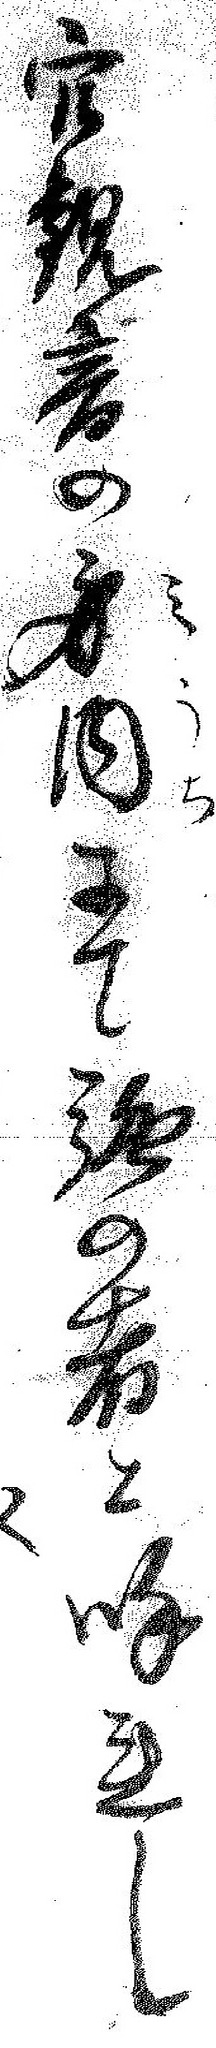穴観音の身内にて強の者と呼れし
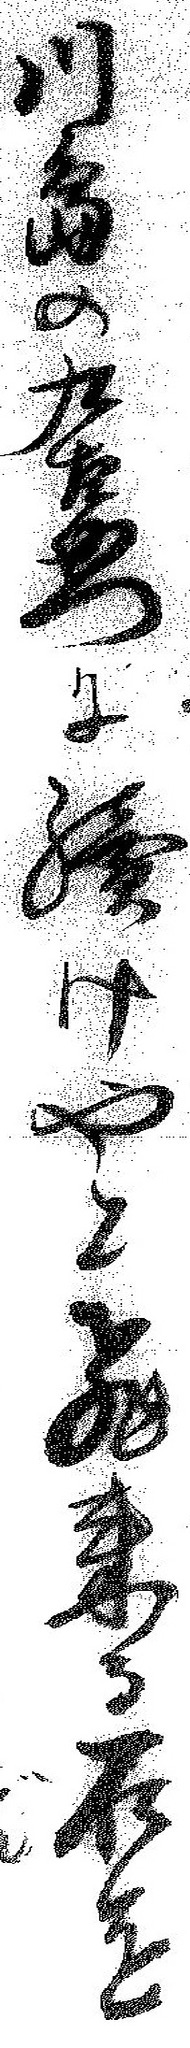川島の九左衛門に続けやと飛来る石を
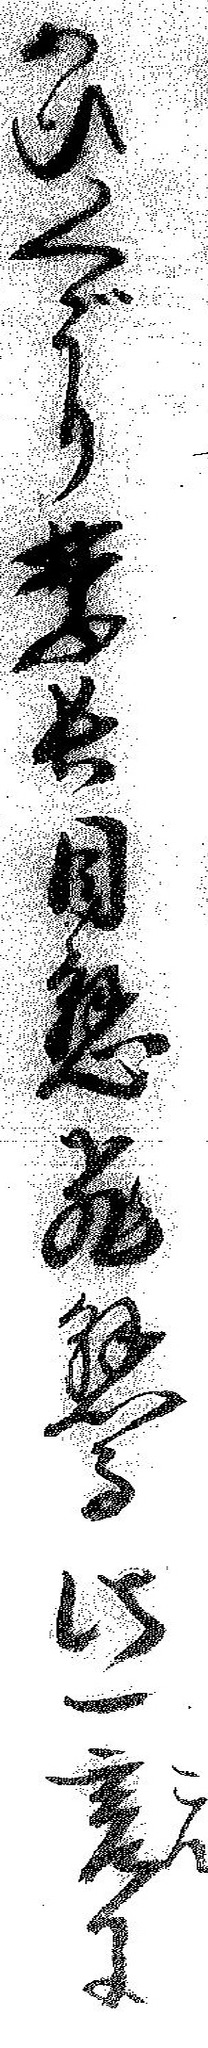かひくゞり禁長目懸飛懸るこの一言に
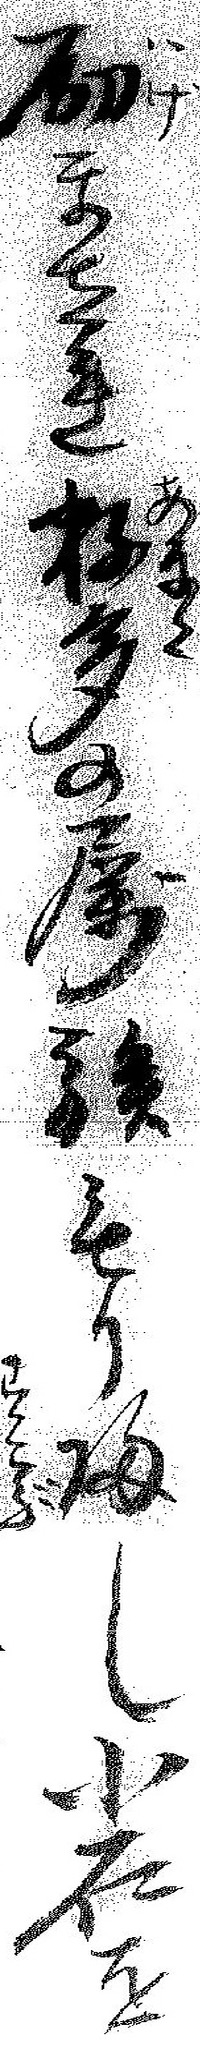励まされ数多の属族もり帰し小石を
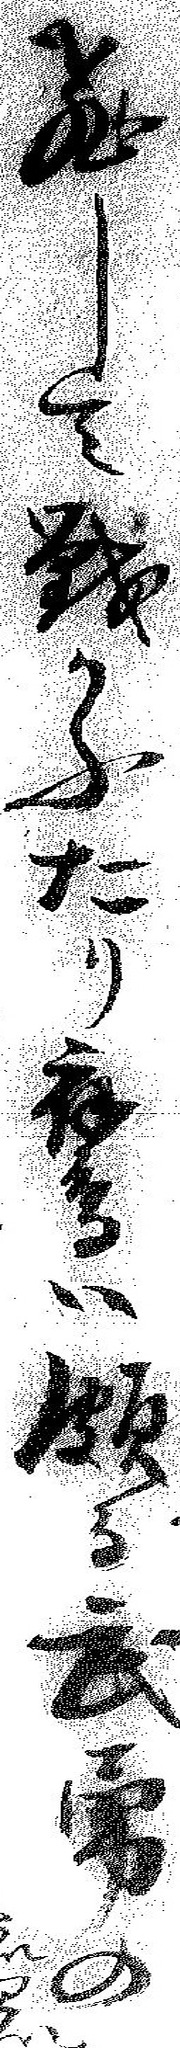飛して戦かふたり鷹は頗る武勇の
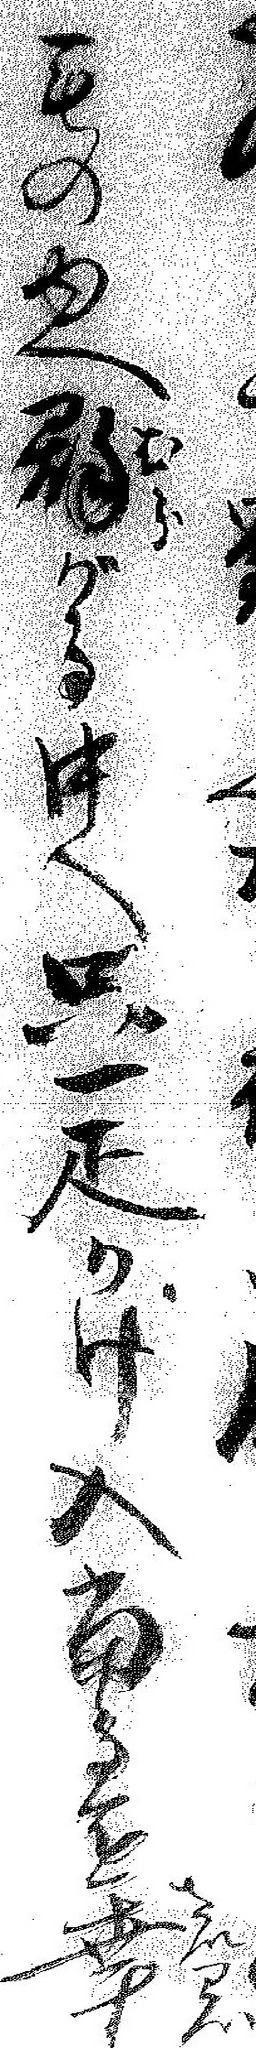ものゆへ群がる中へ只一疋かけ入当るを幸
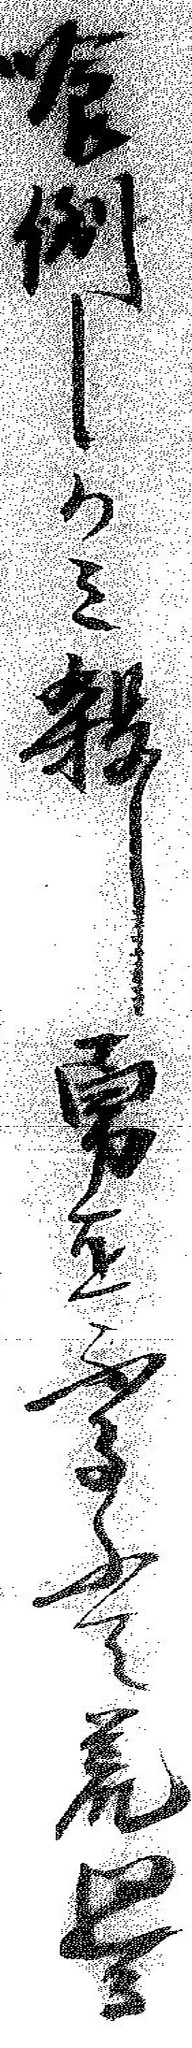喰倒しかみ殺し勇をふるふて荒廻る
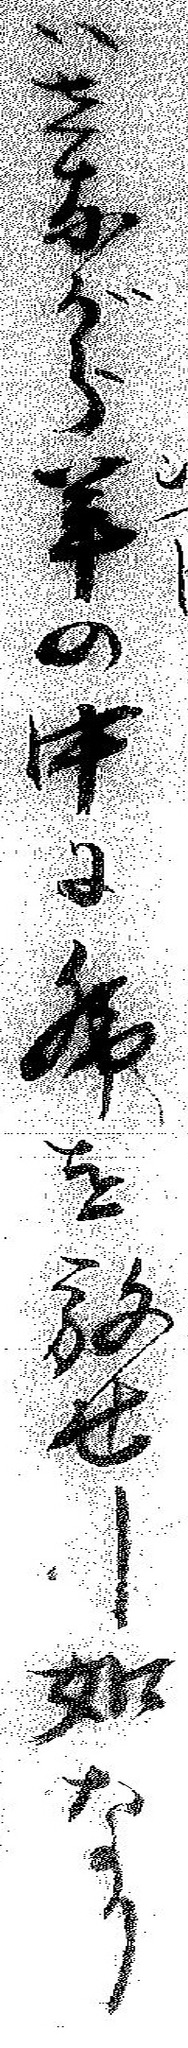はさながら羊の中に乕を放せし如なり
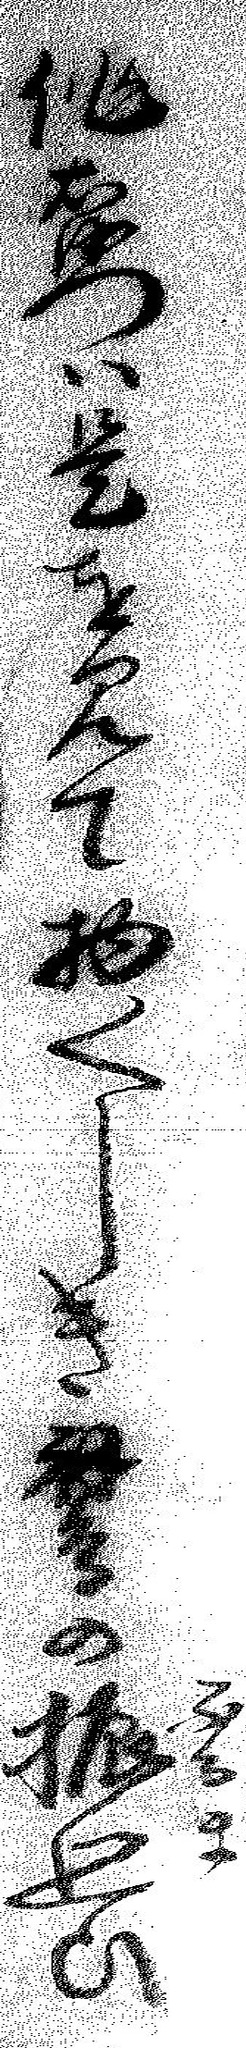作右衛門は是を見て物〳〵しき鷹の振廻い

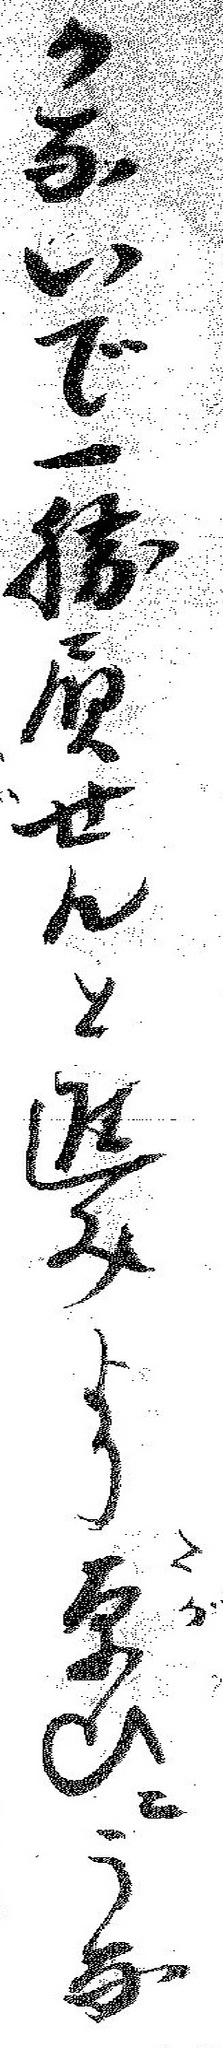かないで一勝負せんと進みより互ひにうな
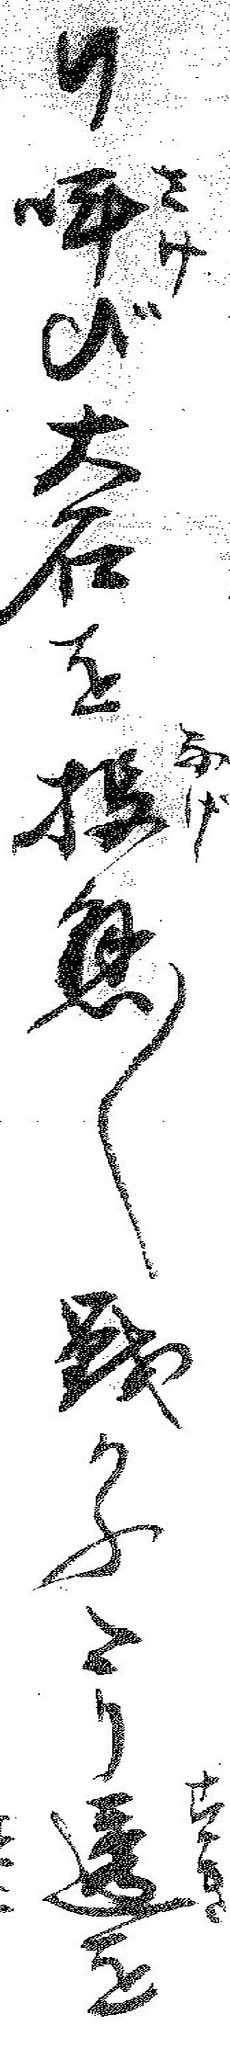り叫び大石を投懸〳〵戦かふたり透を
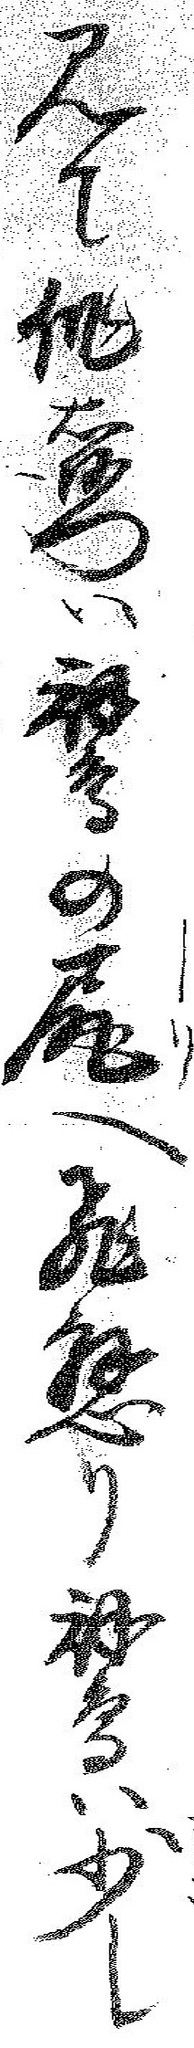見て作右衛門は鷹の尻へ飛懸り鷹は少し
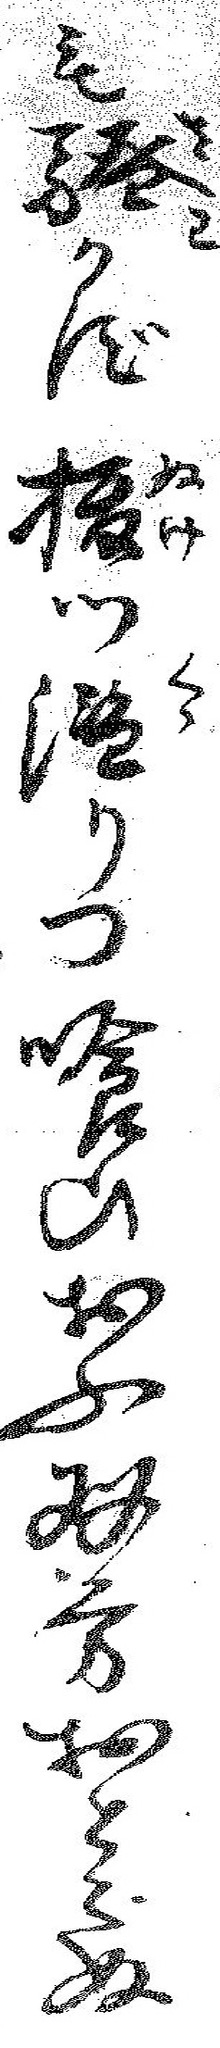も騒がず抜つ潜喰ひおふ双方おとらぬ
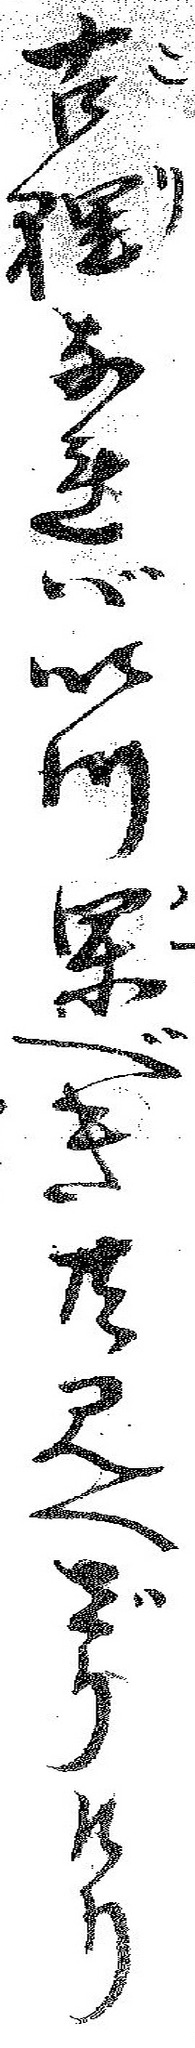狐狸なればいつ果べき共見へざりけり
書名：近頃古狸珍説　礼義智信
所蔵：徳島県立図書館
